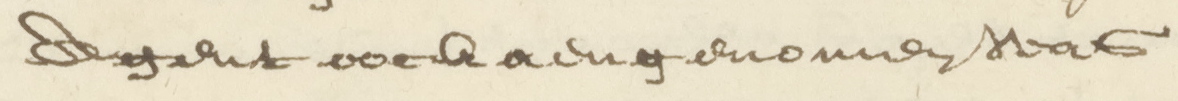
Agent oock aengenomen was
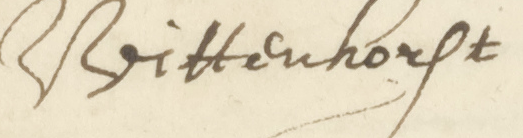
Wittenhorst
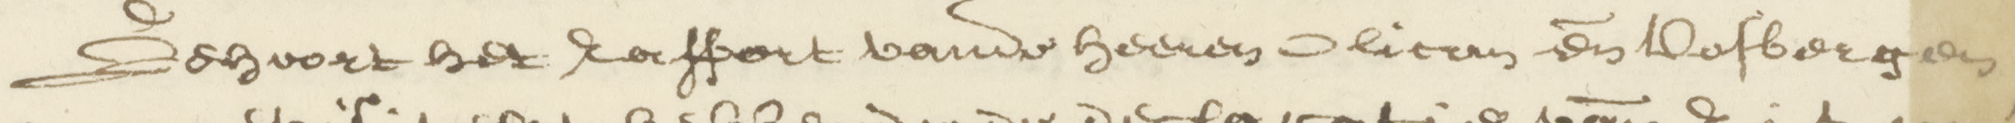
Gehoort het rapport vande heeren Olican en Vosbergen
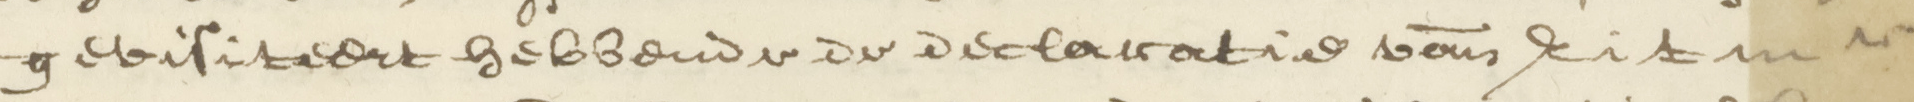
gevisiteert hebbende de declaratie van ritmr.
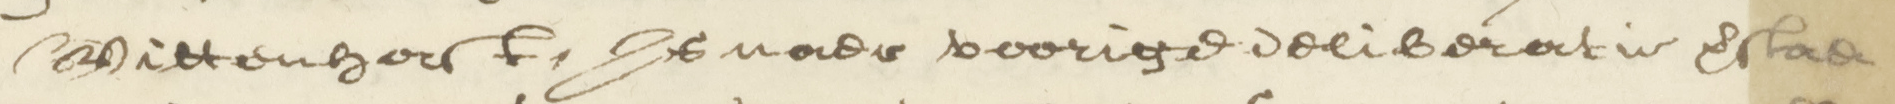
Wittenhorst. Is naer voorige deliberatie vstaen
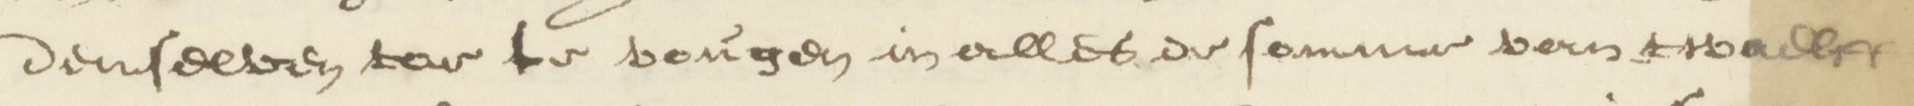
denselven toe te vougen in alles de somme van twaelff
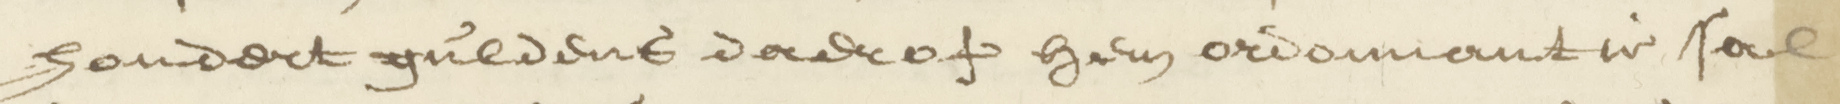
hondert guldens daerop hem ordonnantie sal
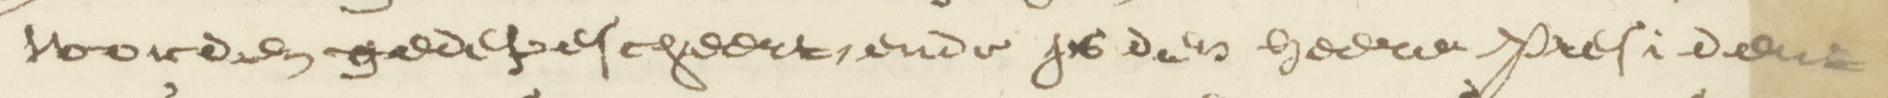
worden gedepescheert, ende Is den heere President
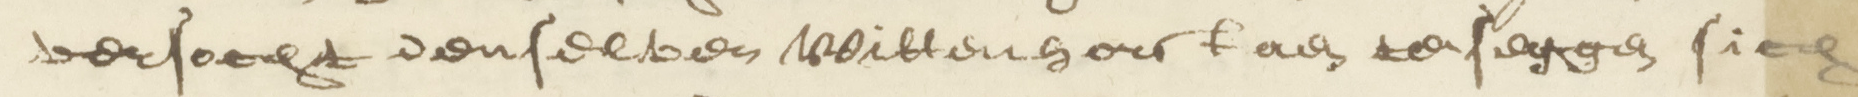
versocht denselven Wittenhorst aen te seggen sich
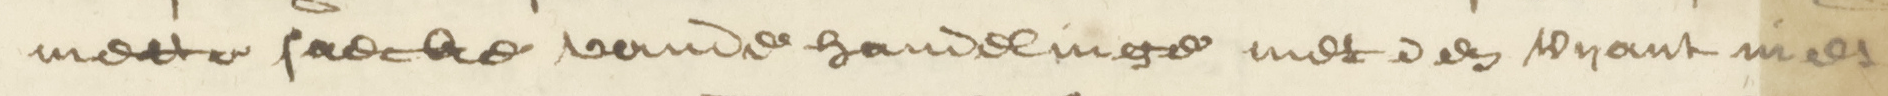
mette saecke vande handelinge met den Vyant niet
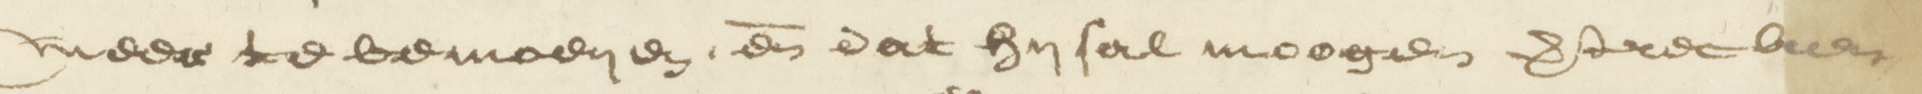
meer te bemoeyen, en dat hy sal moogen vtrecken
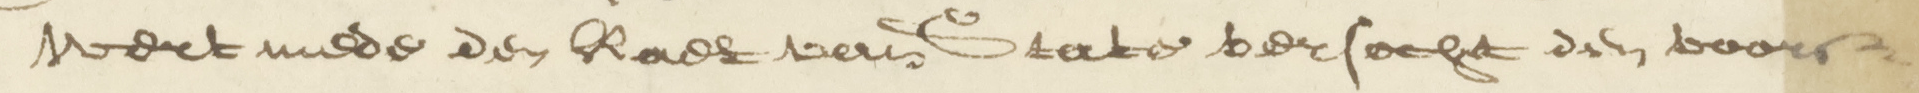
wert mede den Raet van State versocht den voors
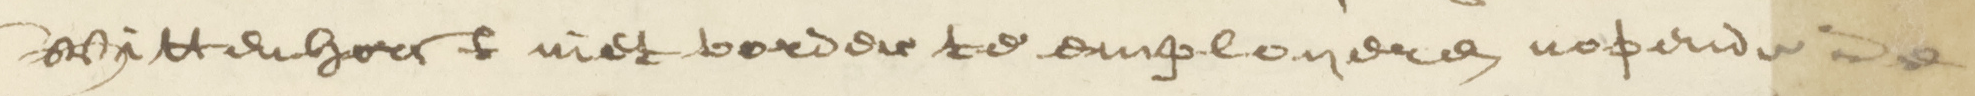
Wittenhorst niet vorder te employeren nopende de
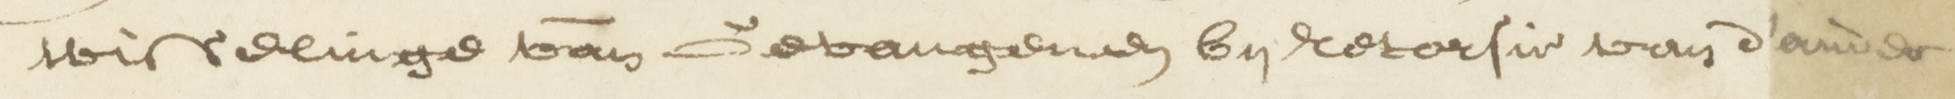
wisselinge van Gevangenen by retorsie van d'ander
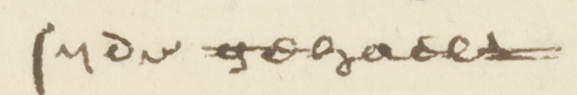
syde gehaelt
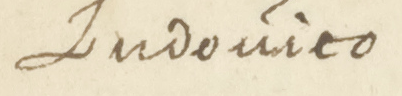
Ludouico
